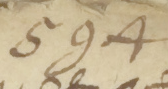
594.
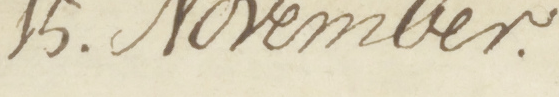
15. November.
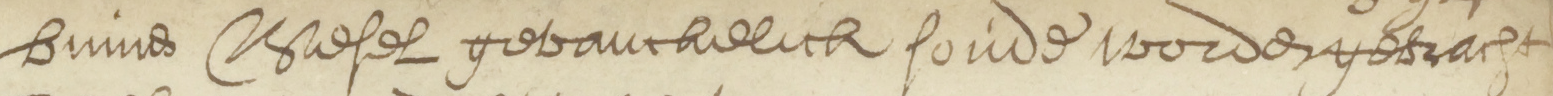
binnen Wesel gevankelick soude worden gebracht
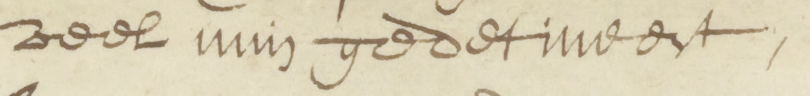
veel min gedetineert.
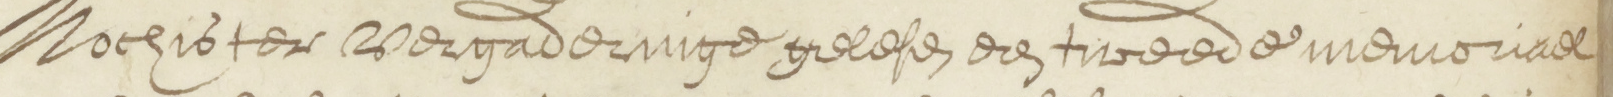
Noch is ter Vergaderinge gelesen een tweede memoriael
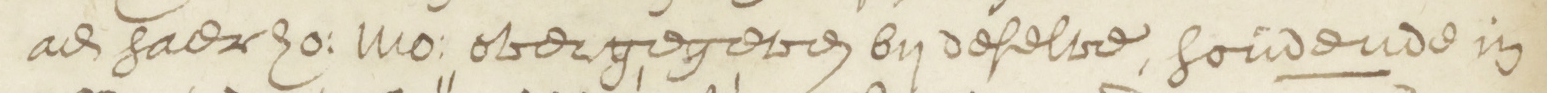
aen haer ho:Mo: overgegeven bij deselve, houdende in
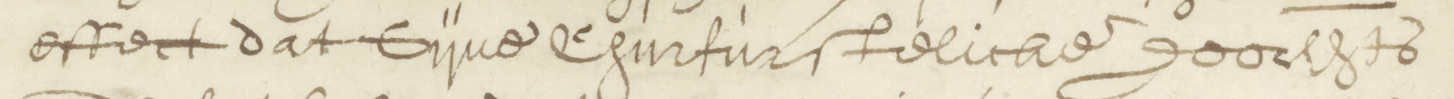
effect dat Sijne Churfurstelicke Doorlhts.
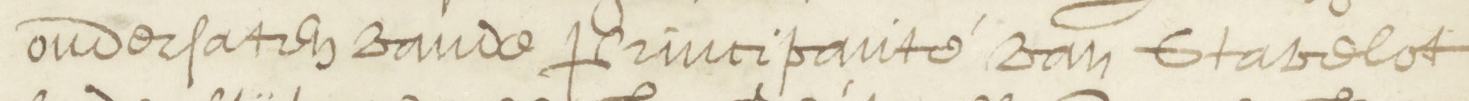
ondersaten vande Principauté van Stavelot
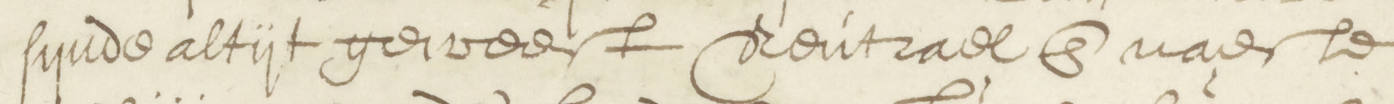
sijnde altijt geweest Neutrael & naeste
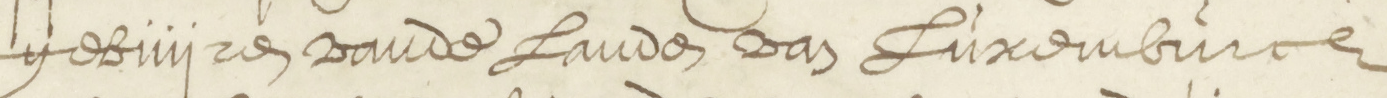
gebuijren vande Landen van Luxemburch
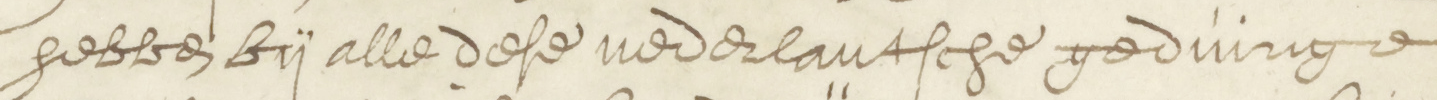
hebben bij alle dese nederlantsche geduirige
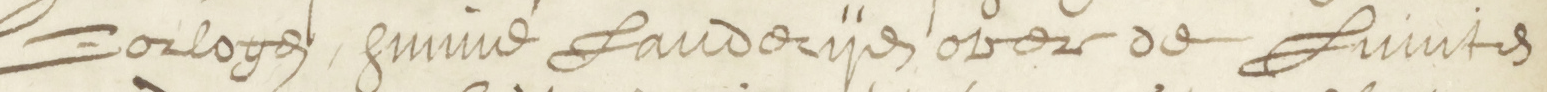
Oorlogen, hunne Landerijen over de Limiten
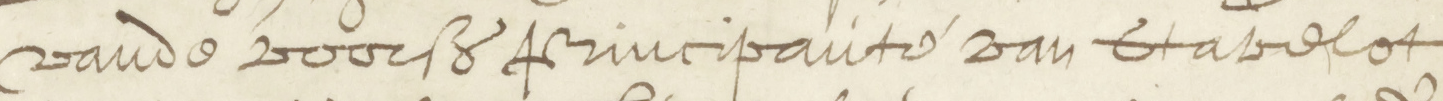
vande voorss Principauté van Stavelot
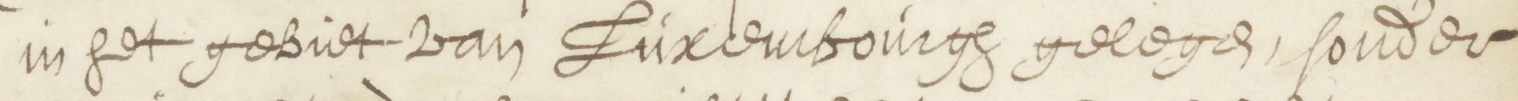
in het gebiet van Luxembourgh gelegen, sonder
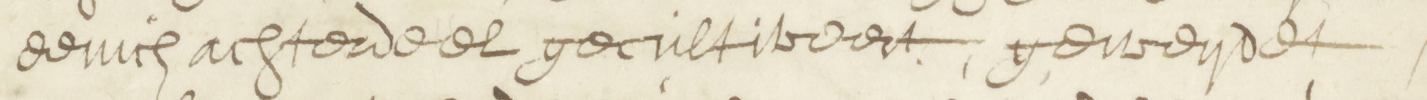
eenich achterdeel gecultiveert, geweydet
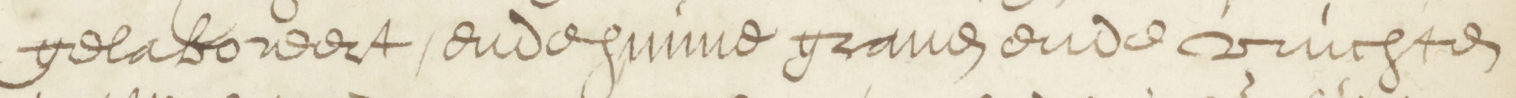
gelaboreert ende hunne granen ende vruchten
